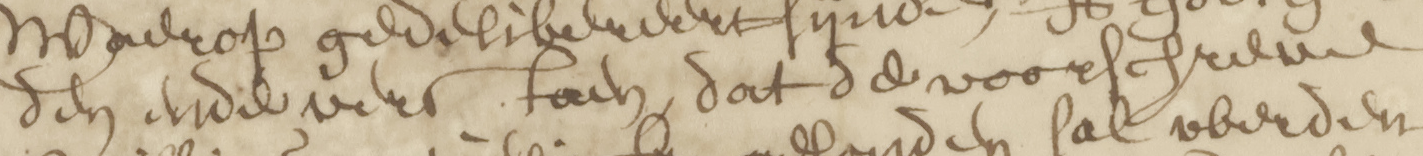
den ende verstaen, dat de voorschreve
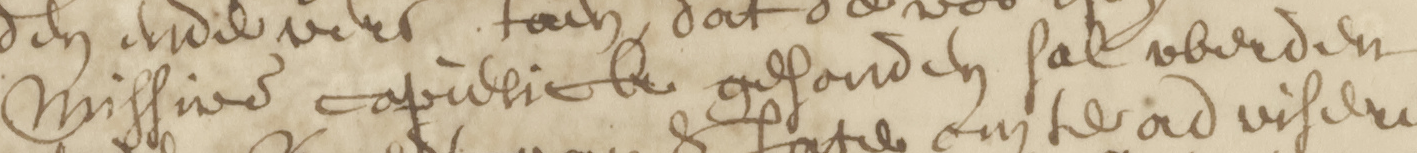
missive copielick gesonden sal werden
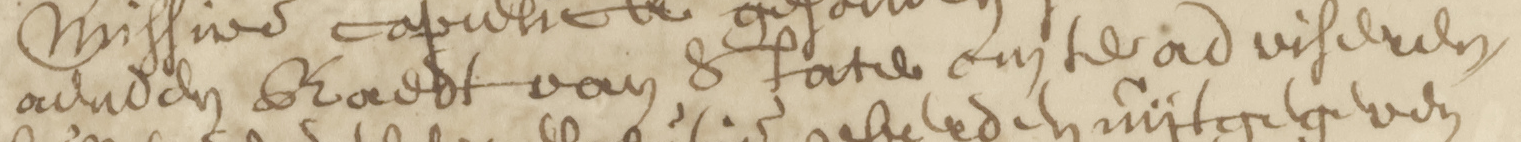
aenden Raedt van State om te adviseren,
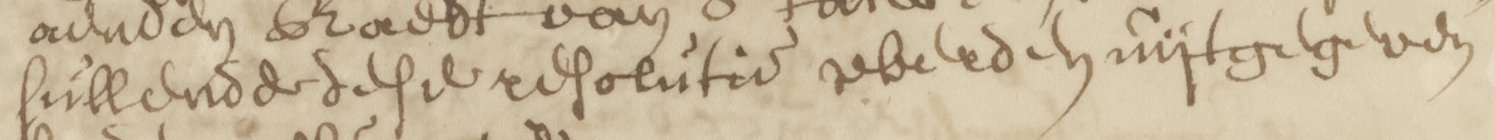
sullende dese resolutie werden uijtgegeven
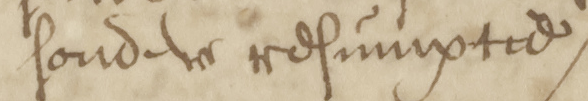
sonder resumptie.
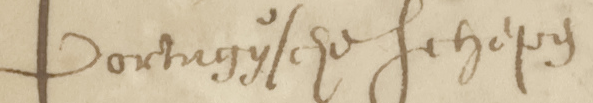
Portugijsche Schepen
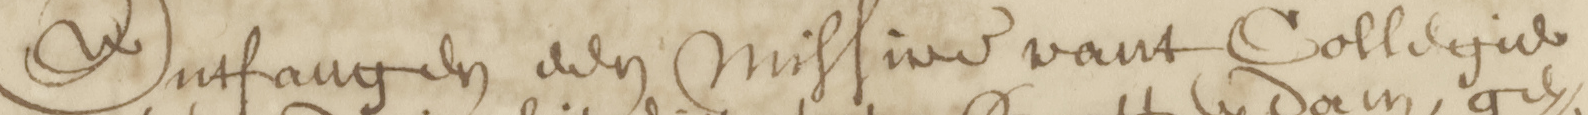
Ontfangen een missive vant collegie
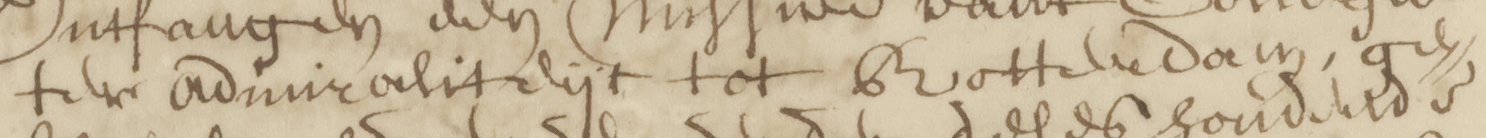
ter admiraliteijt tot Rotterdam, ge„,
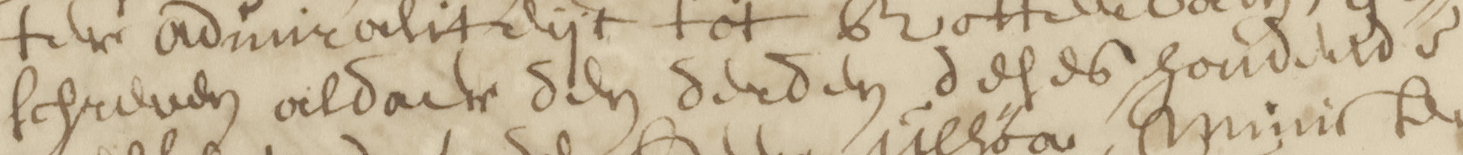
schreven aldaer den derden deses, houdende
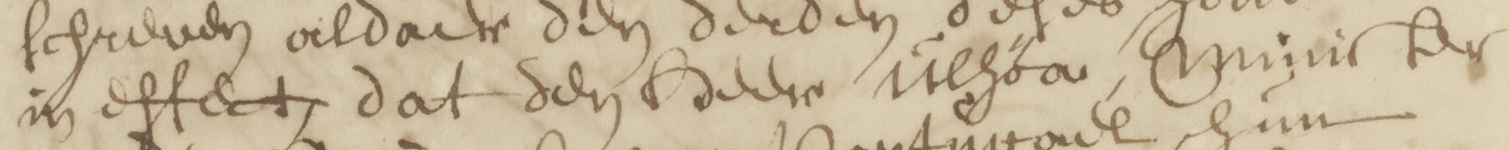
in effect, dat den Heer Ulhöa, minister
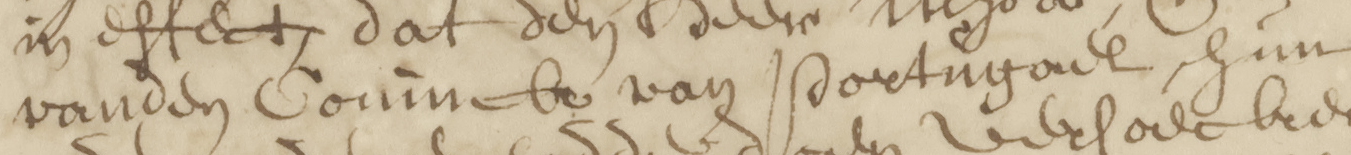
vanden Coninck van Portugael, hun
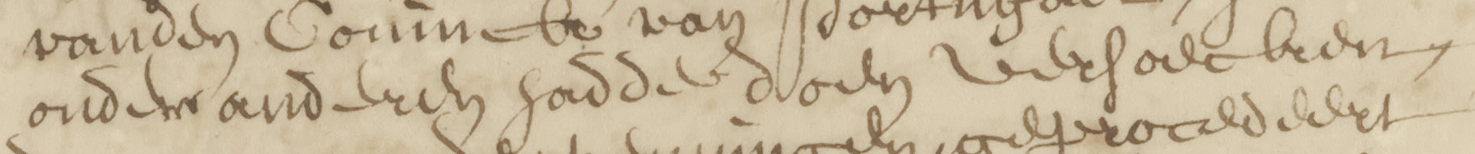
onder anderen hadde doen versoecken,
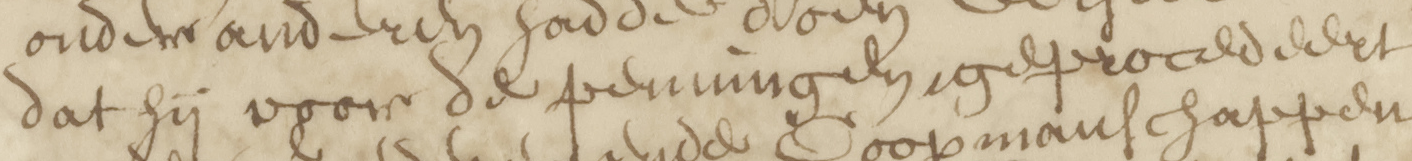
dat sij voor de penningen, geprocedeert
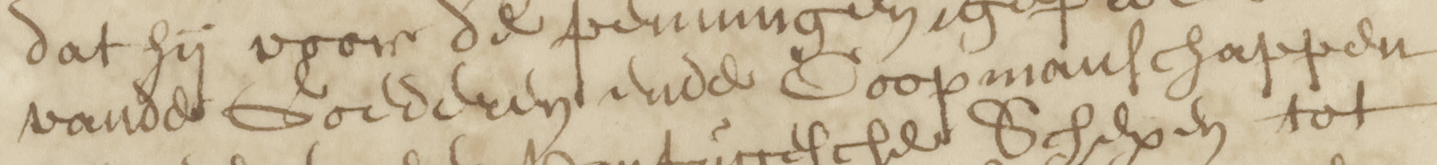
vande Goederen ende Coopmanschappen
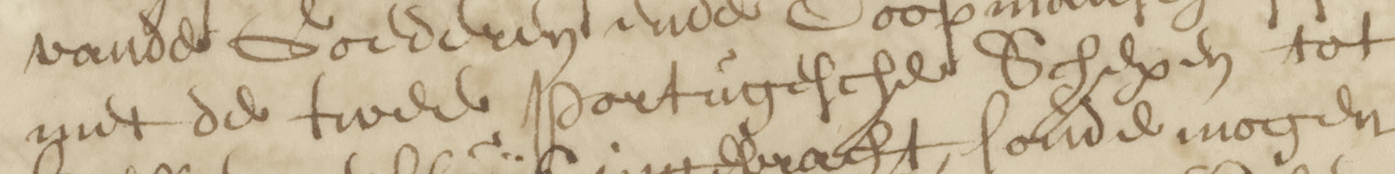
met de twee Portugesche Schepen tot
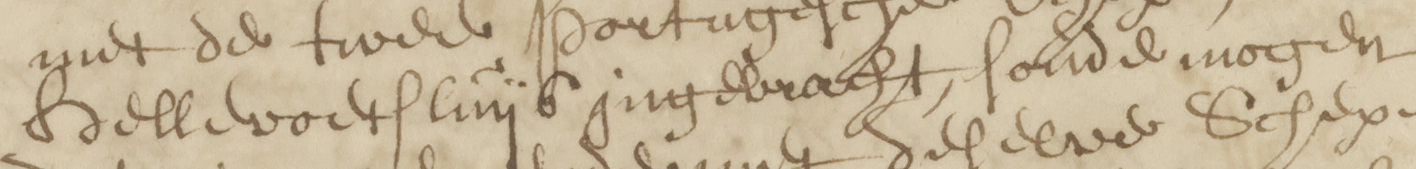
Hellevoetsluijs ingebracht, soude mogen
